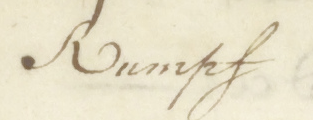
Rumpf
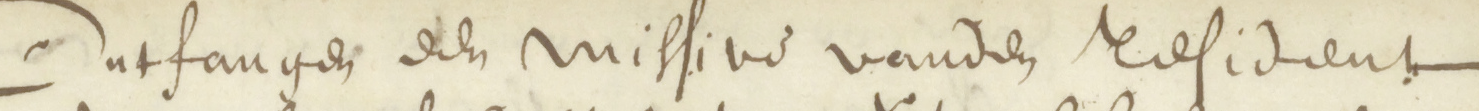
Ontfangen een missive vanden resident
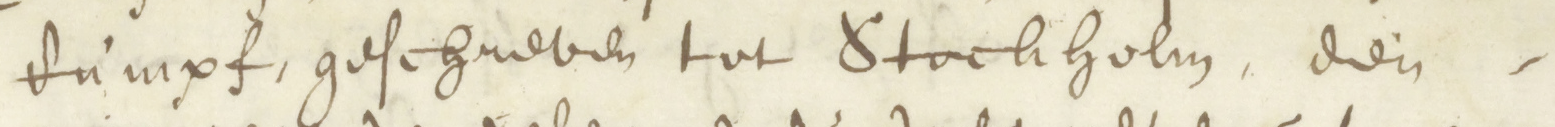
Rumpf, geschreven tot Stockholm, den
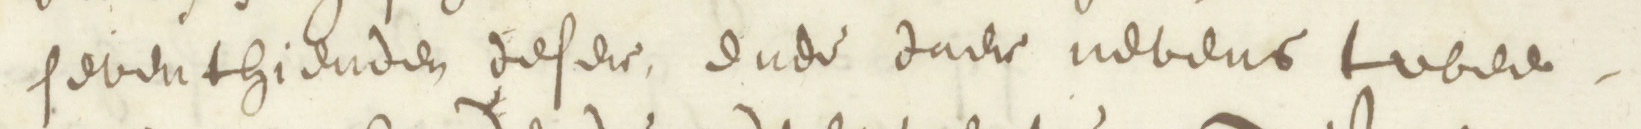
seventhienden deser, ende daer nevens twee -
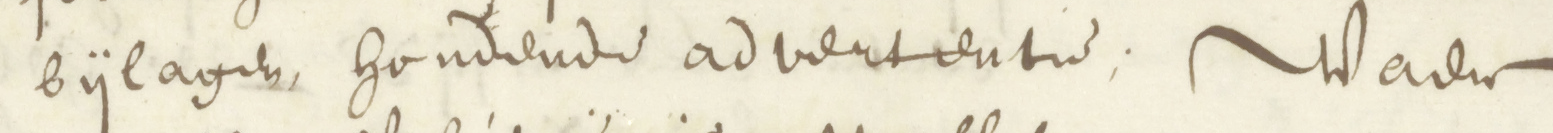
bijlagen, houdende advertentie: Waer
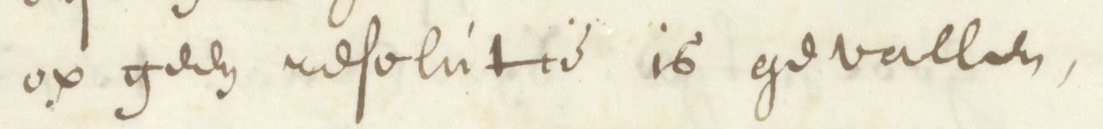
op geen resolutie is gevallen.
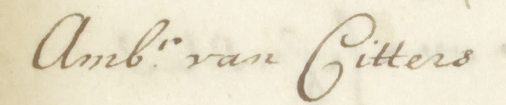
Ambr. van Citters
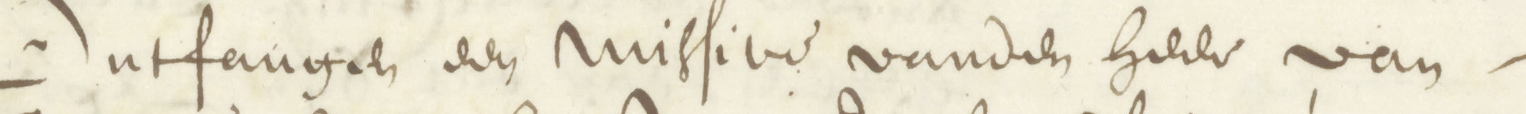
Ontfangen een missive vanden heer van
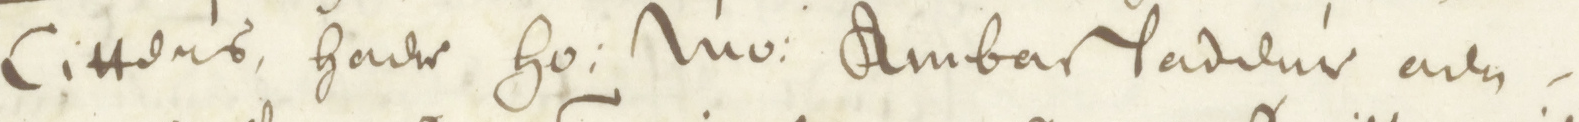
Citters, haer ho:mo: Ambassadeur aen
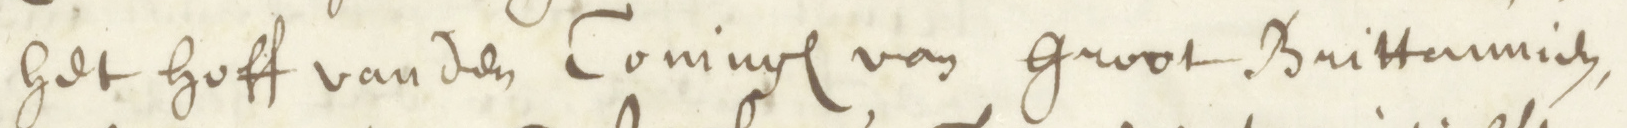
het hoff vanden Coningh van Groot Brittannien,
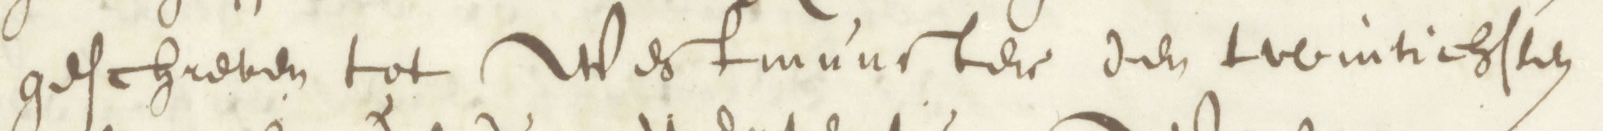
geschreven tot Westmunster den twintichsten
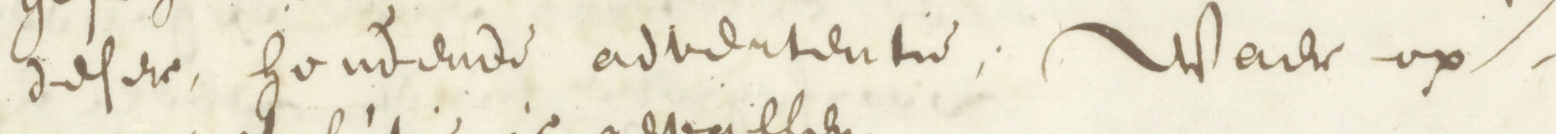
deser, houdende advertentie: Waer op
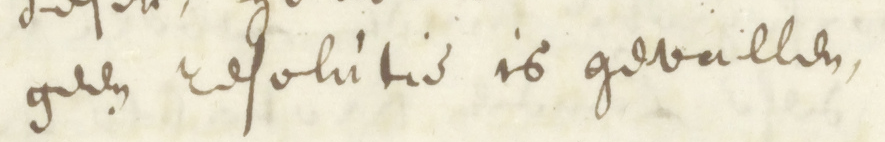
geen resolutie is gevallen.
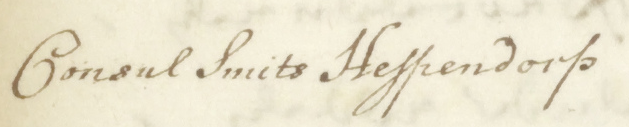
Consul Smits Heppendorp
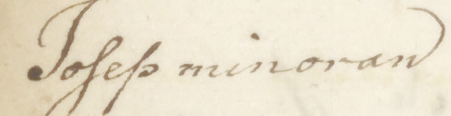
Josep minoran
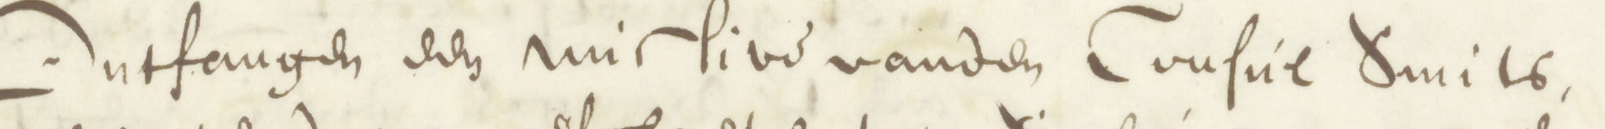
Ontfangen een missive vanden Consul Smits,
